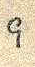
9
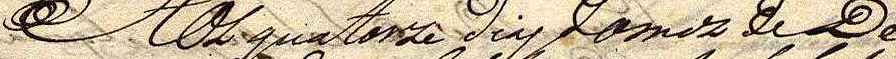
Aoz quatroze dias do mez de De
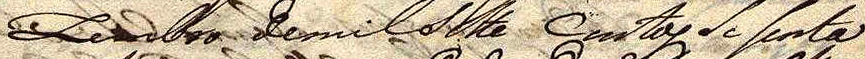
Zembro de mil Settecentos sesenta
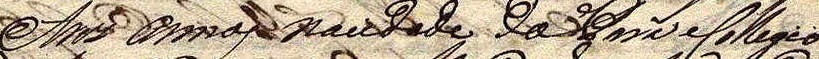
e trez annos na cidade do Para e Collegio
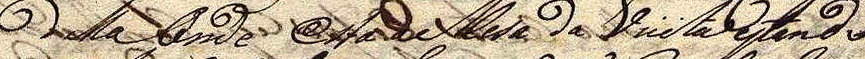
della Sende esta Mesa da Visita estando
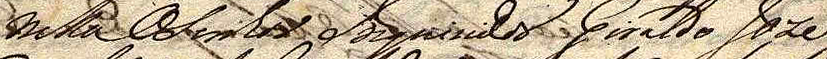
nesta O Senhor Inquizidor Giraldo Joze
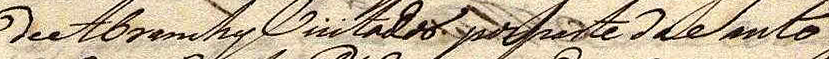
de Abranches Visitador por parte da Santo
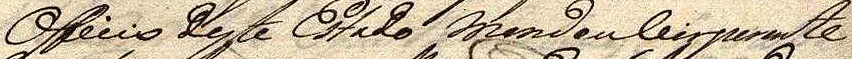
Officio deste Estado mandou vir perante
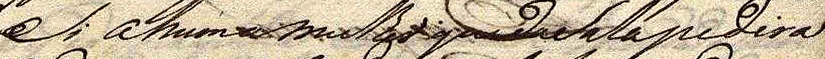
a si a huma mulher que da sala pedira
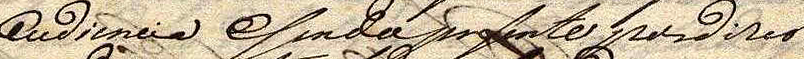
audiencia e sendo presente por dizer
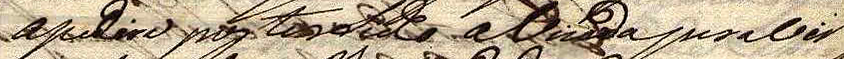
a pedira por ter Sido aVizada para vir
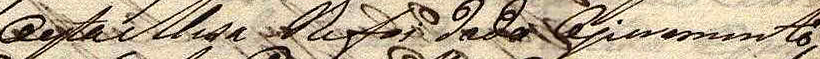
a esta Mesa lhe foi dado o juramento
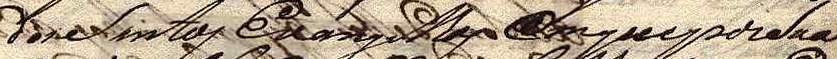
dos santos Evangelhos em que poz sua
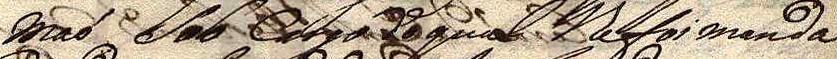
maõ sob cargo do qual lhe foi manda
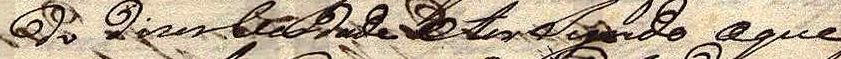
do dizer verdade e ter segredo o que
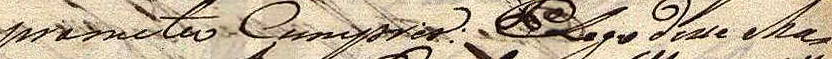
prometeo Cumprir: E Logo disse cha
